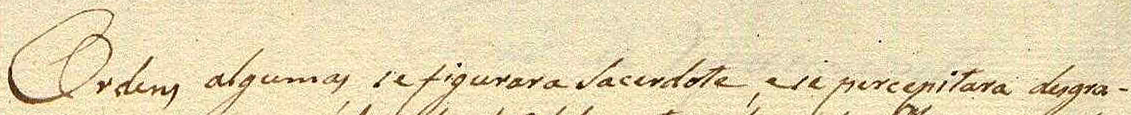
Ordens algumas se figurara sacerdote, e se percepitara desgra
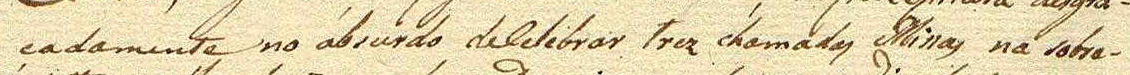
çadamente no absurdo de Celebrar trez chamadas Missas na sobre
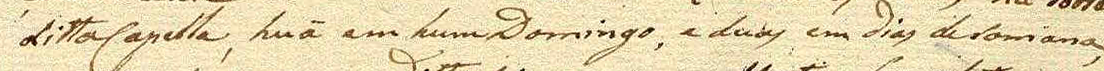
ditta Capella, huā em hum Domingo, e duas em dias de somana,
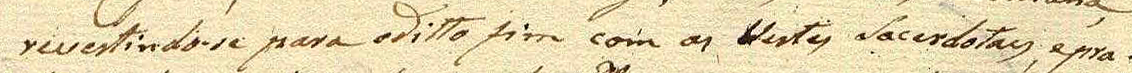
revestindo-se para o ditto fim com as Vestes Sacerdotaes, e pra
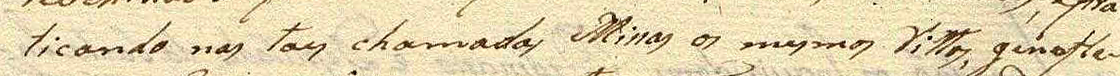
ticando nas taes chamadas Missas os mesmos Rittos, genofle
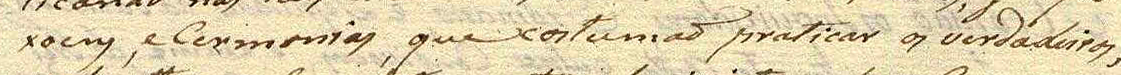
xoens, e Cermonias, que costumaõ praticar os verdadeiros,
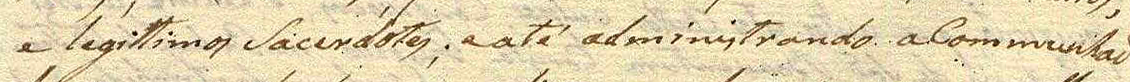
e legittimos Sacerdotes; e até administrando a Communhaõ
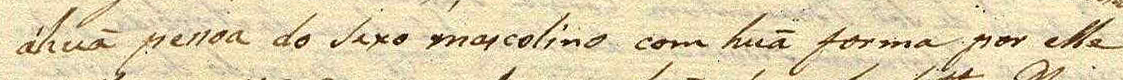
á huā pessoa do sexo mascolino com huā forma por elle
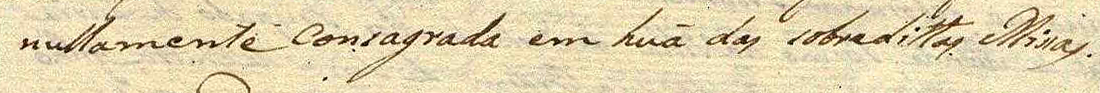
nullamente consagrada em huā das sobredittas Missas.
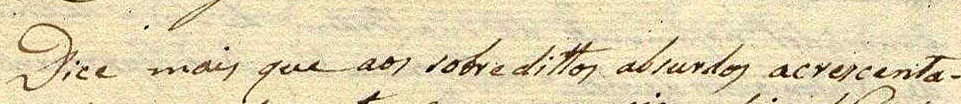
Dice mais que aos sobredittos absurdos acrescenta
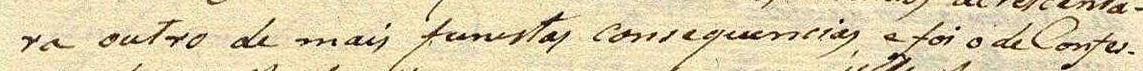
ra outro de mais funestas consequencias, e foi o de Confes
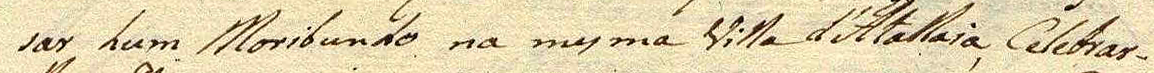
sar hum Moribundo na mesma Villa d'Atallaia, Celebrar
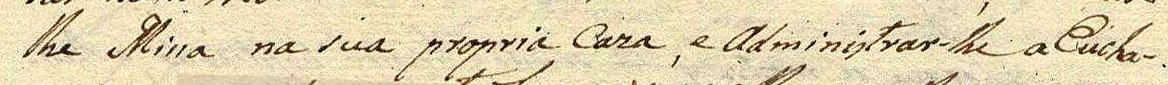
lhe Missa na sua propria caza, e Administrar-lhe a Eucha
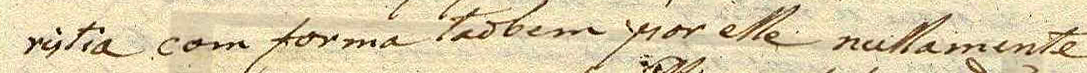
ristia com forma taõbem por elle nullamente
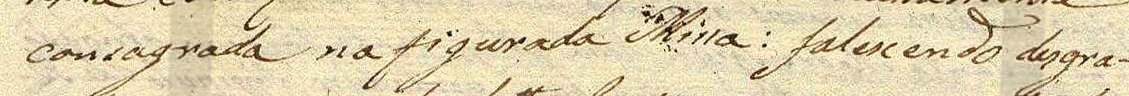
consagrada na figurada Missa: falescendo desgra
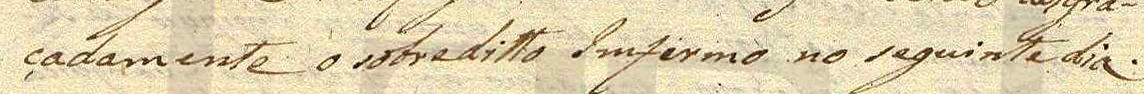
çadamente o sobreditto Imfermo no seguinte dia.
